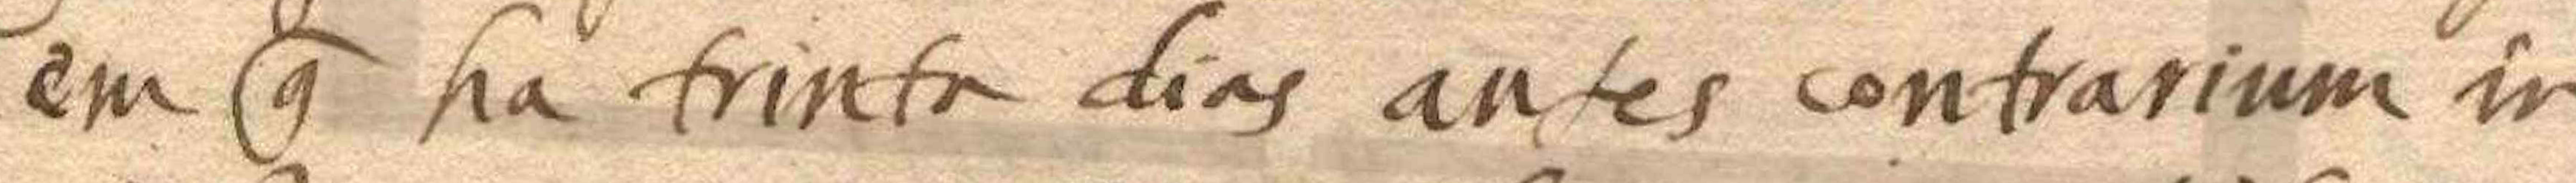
em q̄ ha trinta dias antes contrarium in
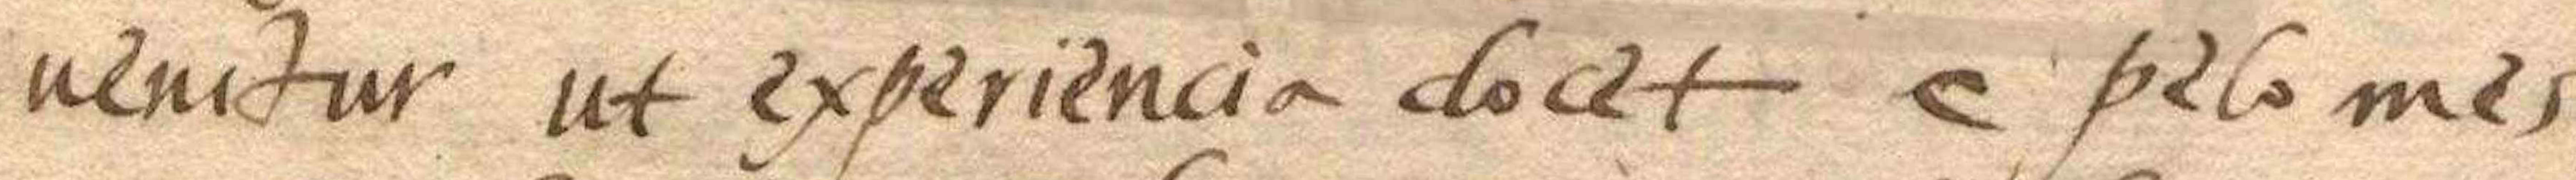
uenitur ut experiencia docet e pelo mes
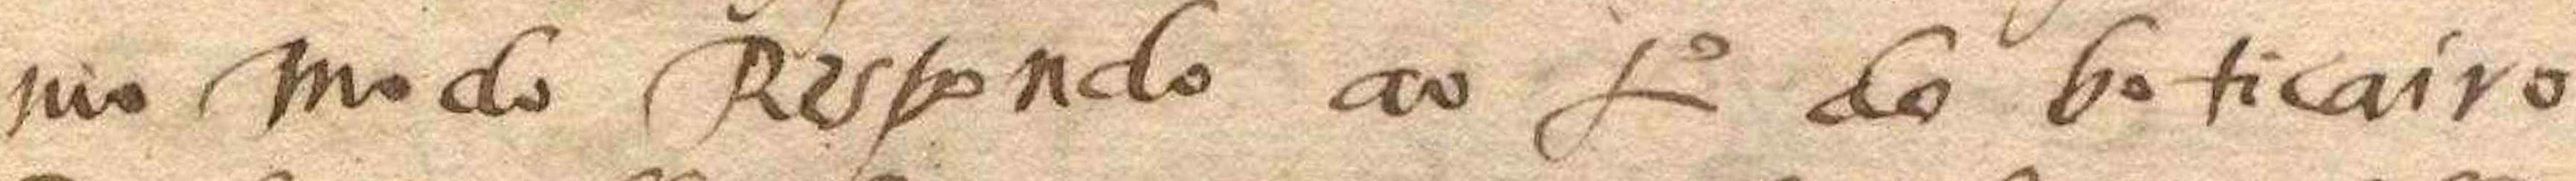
mo modo Respondo ao to do boticairo
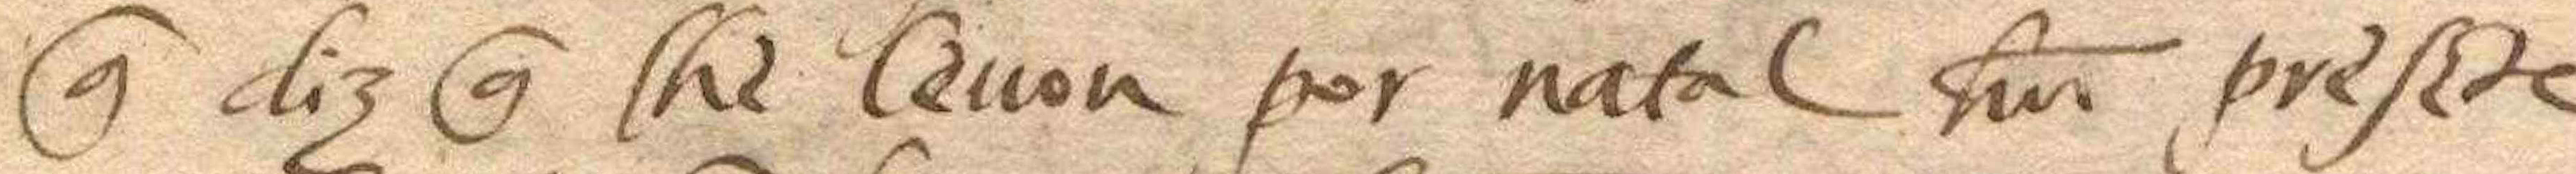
q̄ diz q̄ lhe leuou por natal hū presēte
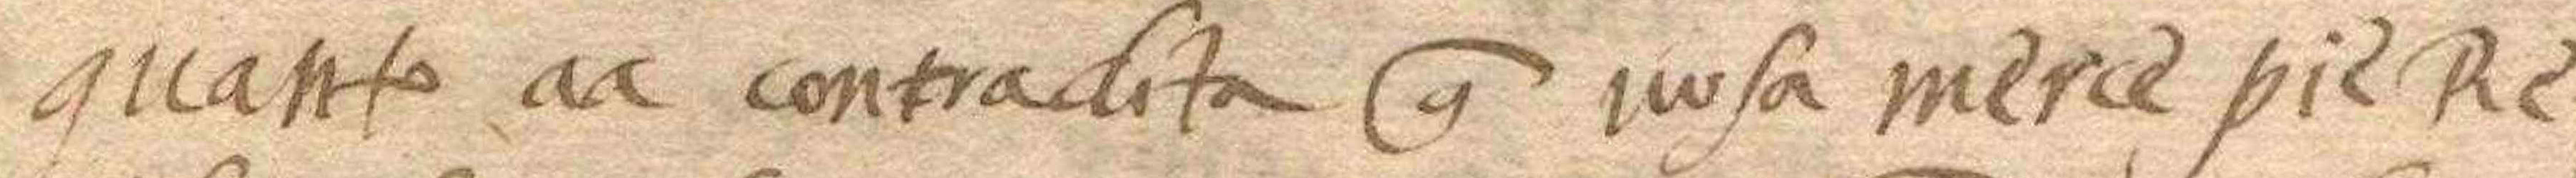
quanto aa contradita q̄ uosa merce pie Re
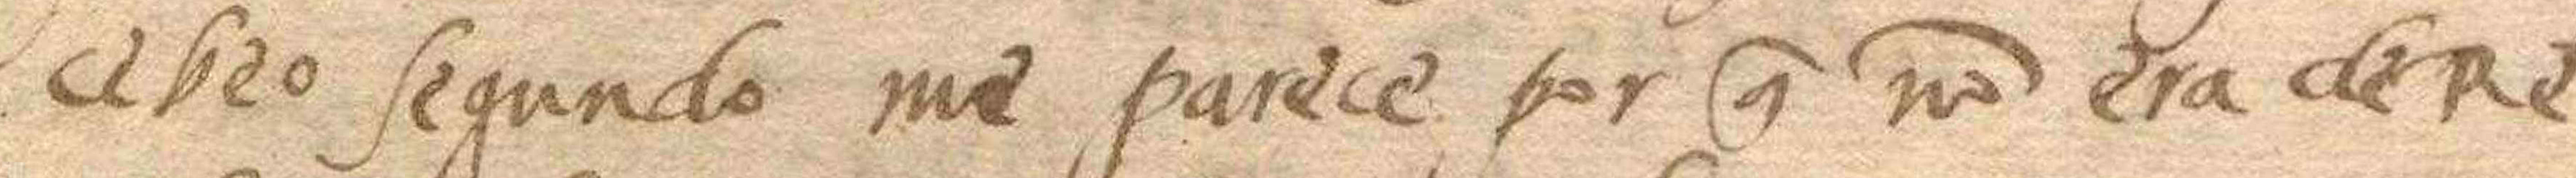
cebeo segundo me parece por q̄ n̄o era de Re
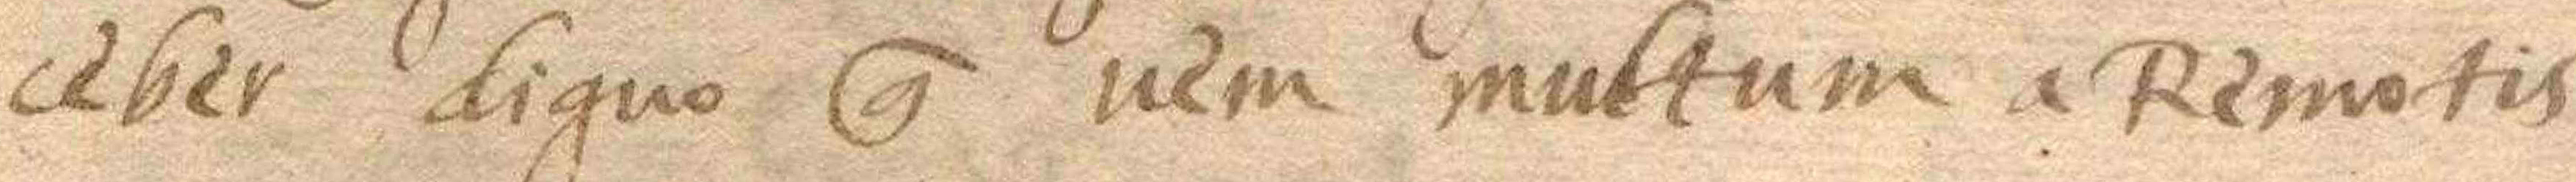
ceber diguo q̄ uem multum a Remotis
